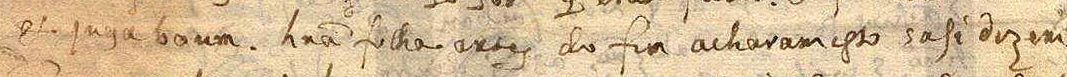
Et jngaboum. huā folha antes do fim acharam isto E asi dizem
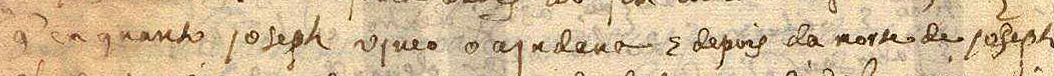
q̄ enquanto joseph vjueo o ajudaua E depois da morte de joseph
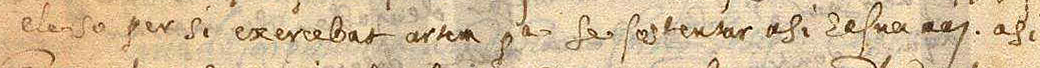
ele se per si exercebat artem pa se sostentar a si E a sua maj. asi
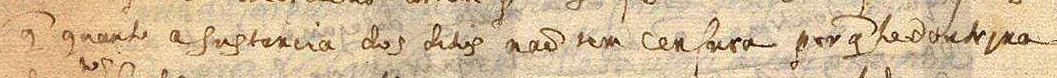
q̄ quanto a sustancia dos ditos naõ tem censura porq̄ he doutrjna
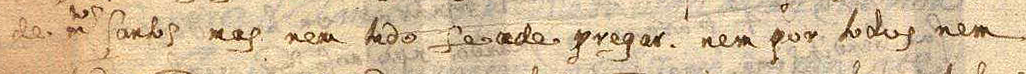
de mtos santos mas nem tudo se ade pregar nem por todos nem
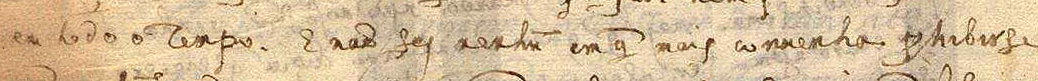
em todo o tempo. E naõ sej nenhū em q̄ mais conuenha ꝓhibirse
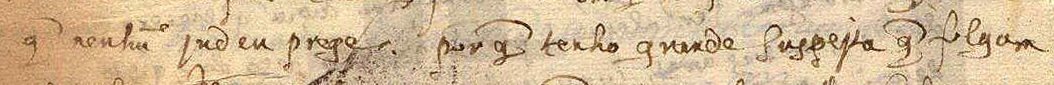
q̄ nenhū judeu prege. porq̄ tenho grande suspejta q̄ folgam
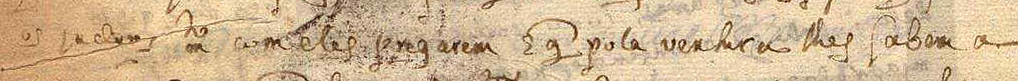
os judeos mto com eles pregarem E q̄ pola ventura lhes sabem a
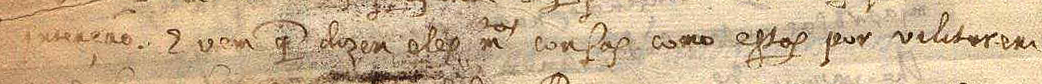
jntençaõ. E vem q̄ dizem eles mtas cousas como estas por vilitarem
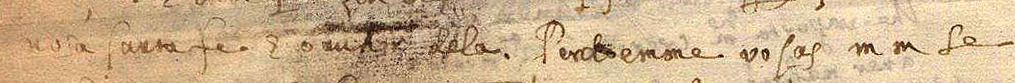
nosa santa fe. E o autor dela. Perdoemme vosas mm se
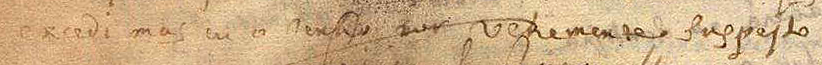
excedi mas eu o tenho por vehemente suspejto
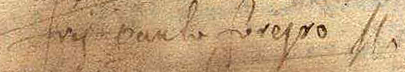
frej paulo forejro //.
